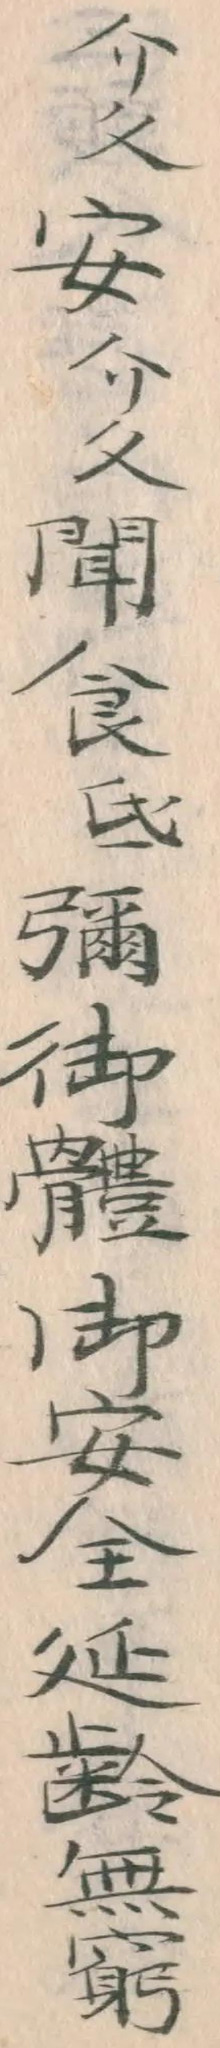介久安介久聞食氐弥御體御安全延齢無窮
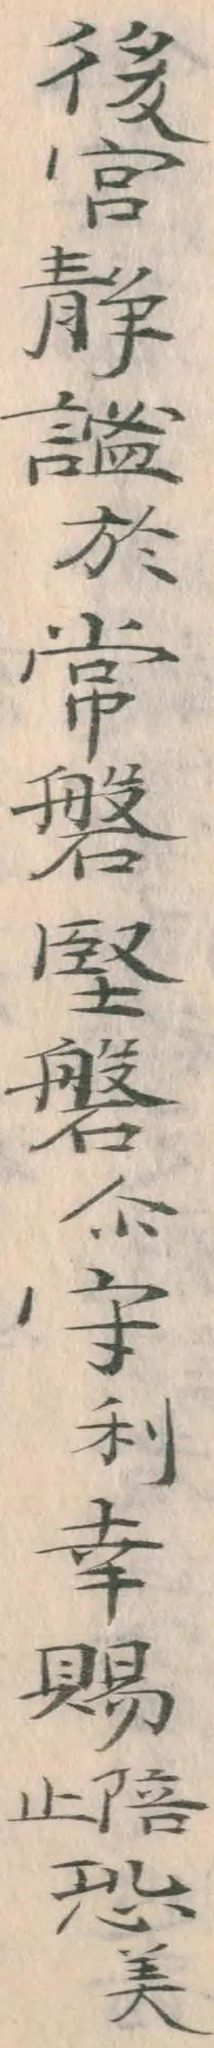後宮静謐於常盤堅盤尒守利幸賜陪止恐美
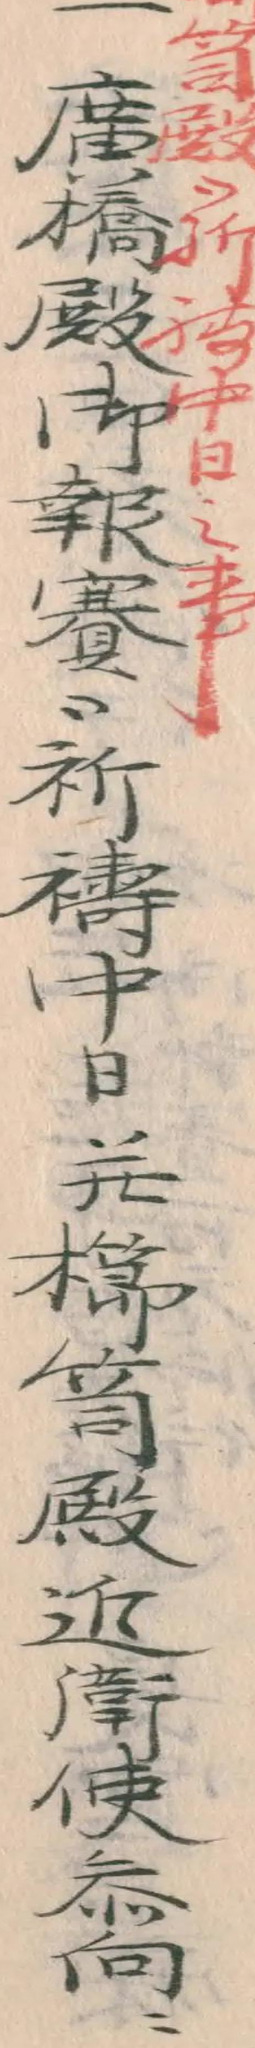一廣橋殿御報賽御祈祷中日并櫛笥殿近衛使参向ニ
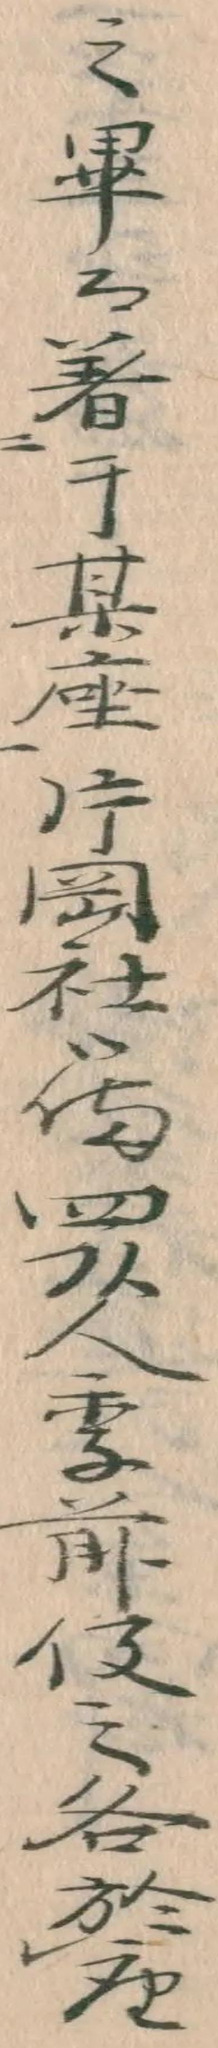之畢而着于某座片岡社御備四頭人季前役之各於座
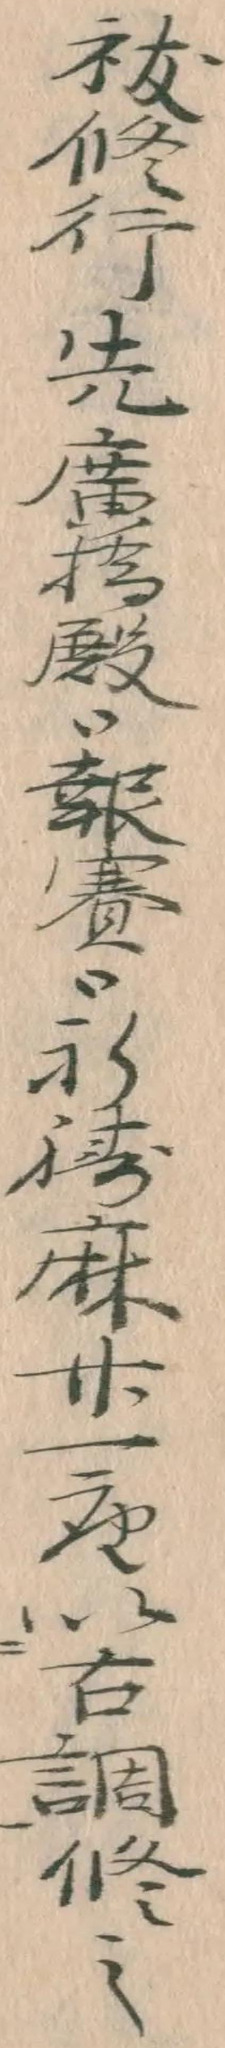祓修行先廣橋殿御報賽御祈祷麻廿一座以古調修之
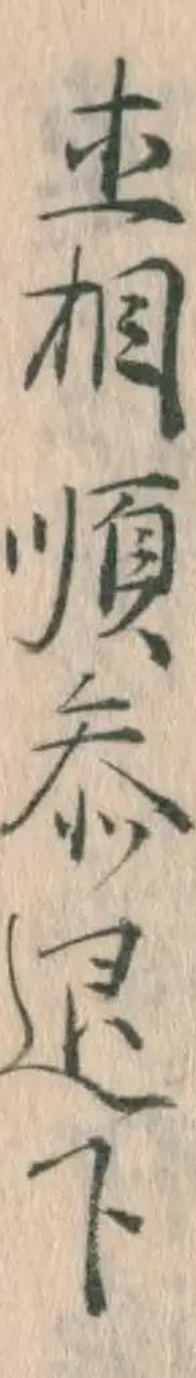直相順参退下
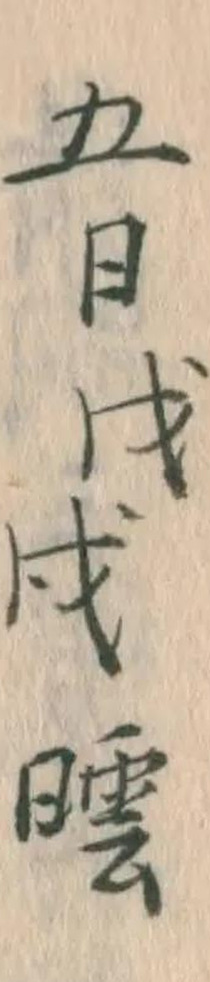五日戊戌曇
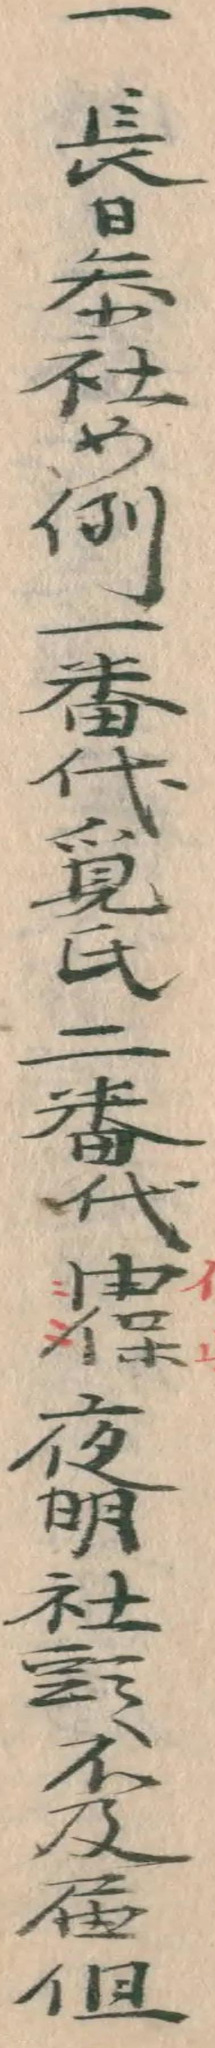一長日参社如例一番代覓氏二番代由保夜明社頭ヘ不及届但
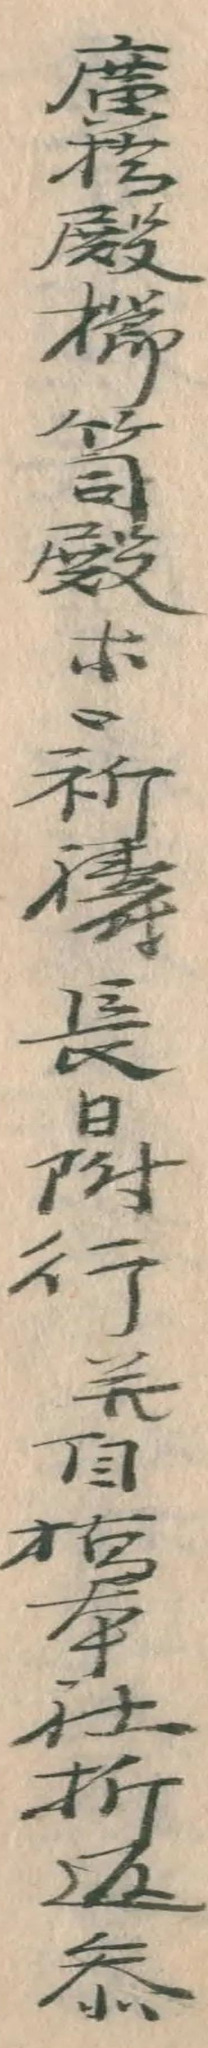廣橋殿櫛笥殿等御祈祷長日附行并自橋本社折返参
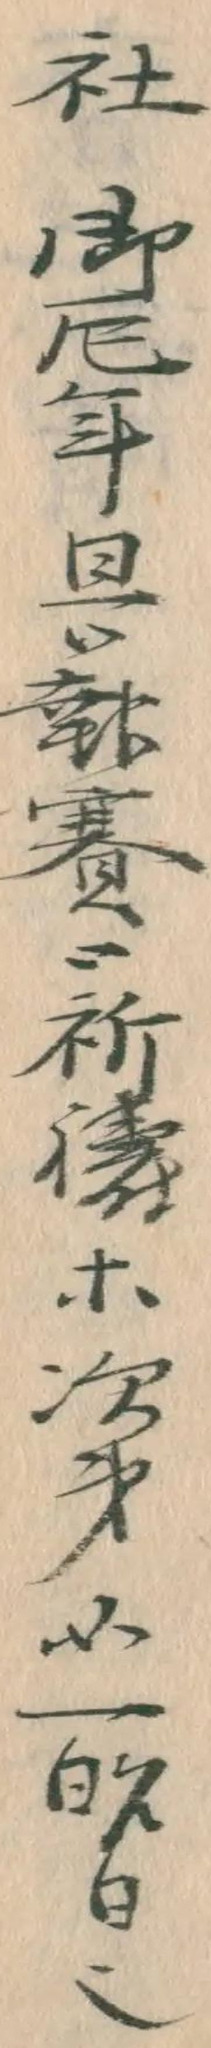社御厄年且御報賽御祈祷等次第如一昨日也

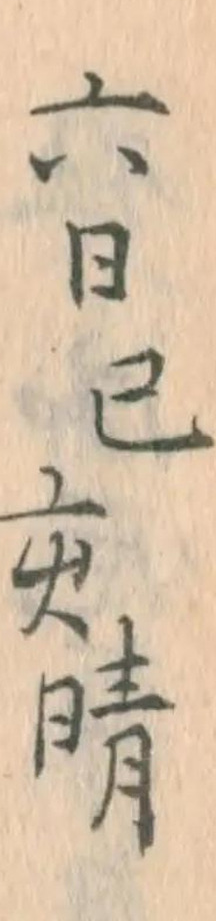六日己亥晴
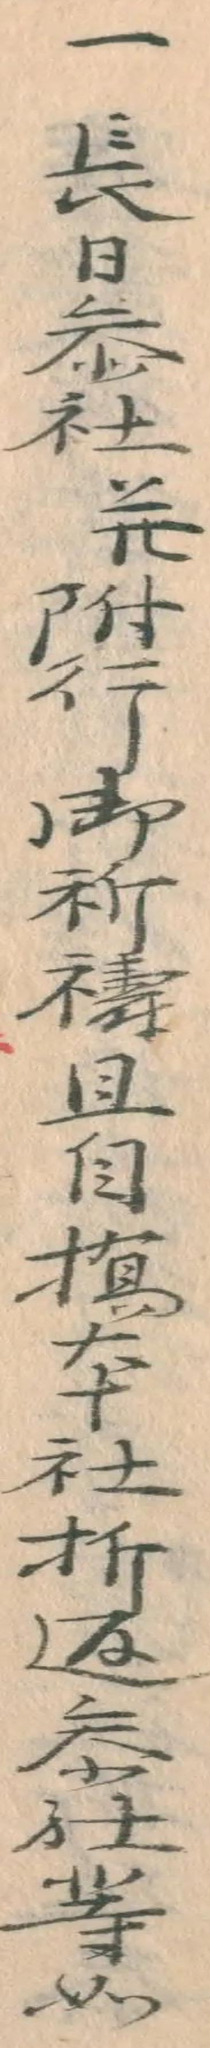一長日参社并附行御祈祷且自橋本社折返参社等如
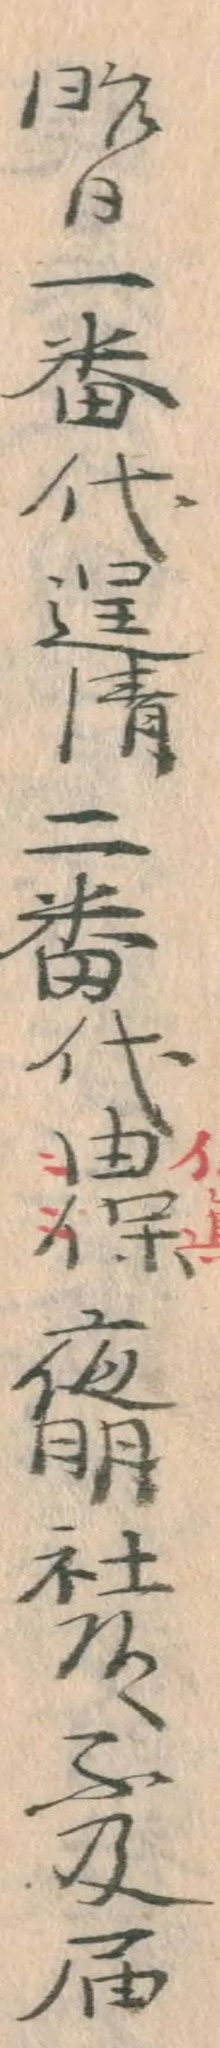昨日一番代逞清二番代由保夜明社頭へ不及届
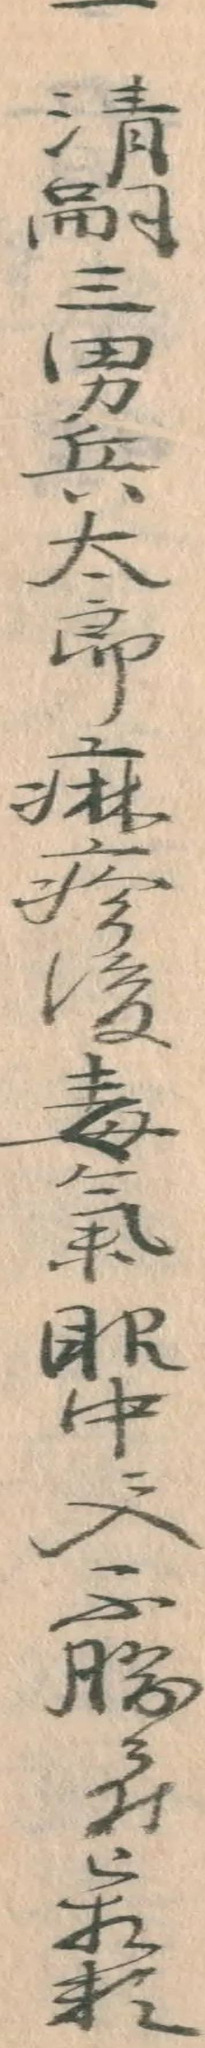一清嗣三男兵太郎麻疹後毒気眼中に入不勝に付被相頼
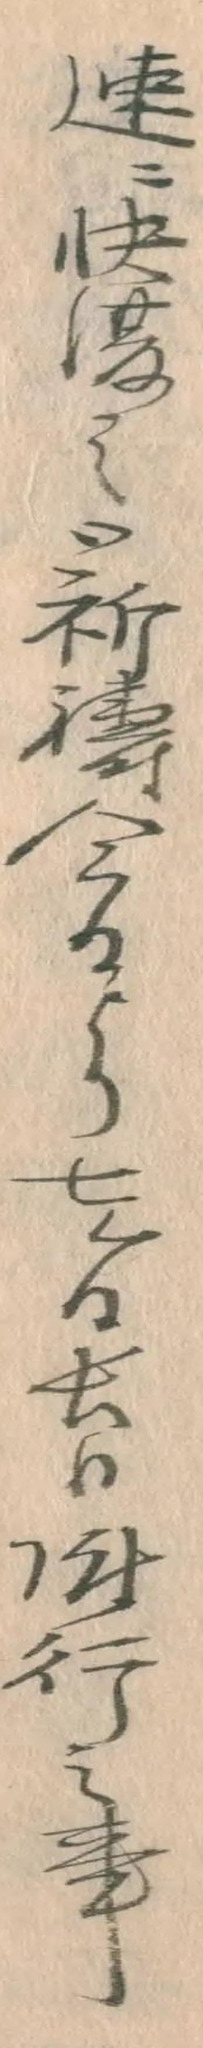速ニ快復之御祈祷今日より七ケ日長日附行之事
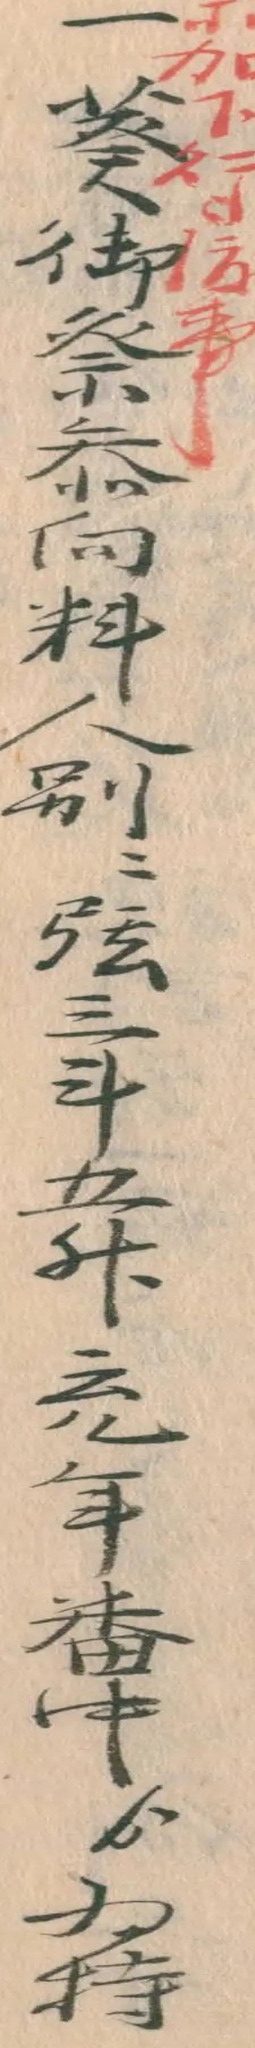一葵御祭参向料人別に弦三斗五升充年番中ゟ為持
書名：賀茂社記録. 第73冊
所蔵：国立国会図書館 National Diet Library, JAPAN
